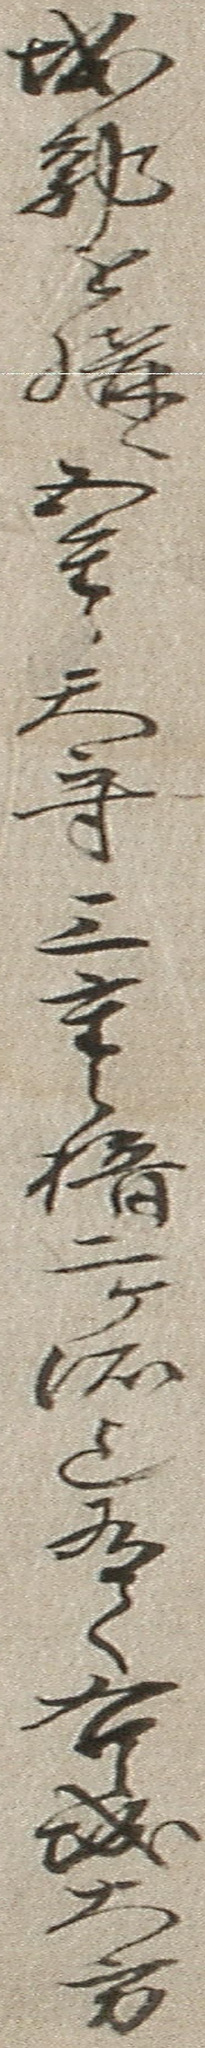城郭を構へ五重之天守三重之櫓二ヶ所迄有之右之城大方
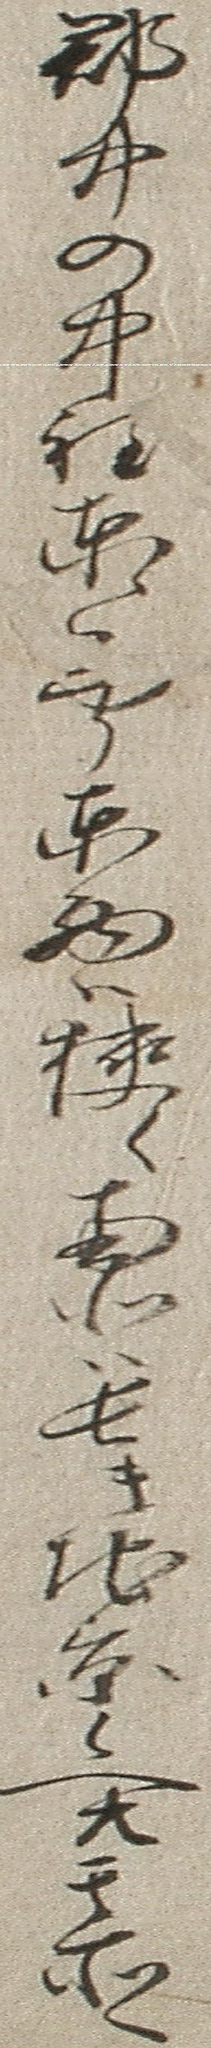郡中の中程東に当り東西は狭く南北は長き地景候へ共其所へ
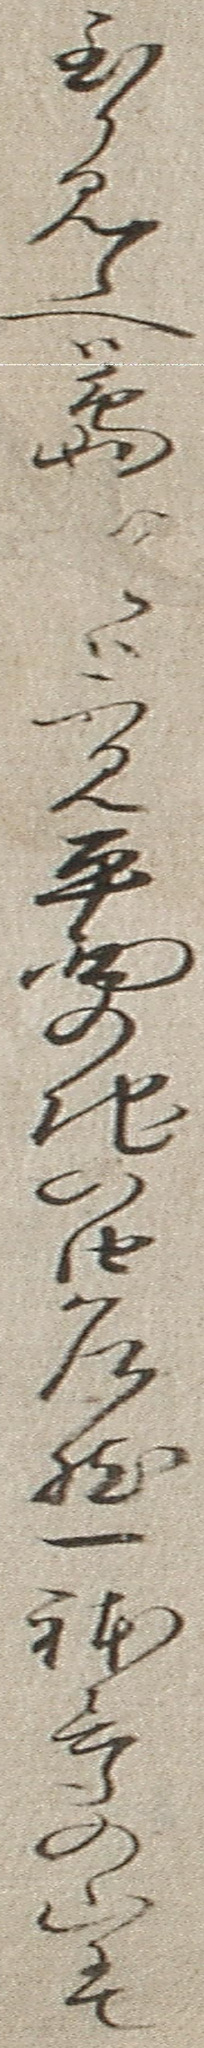至り見候へは島は不見平面の地の由乍然一体壱ツの山にて
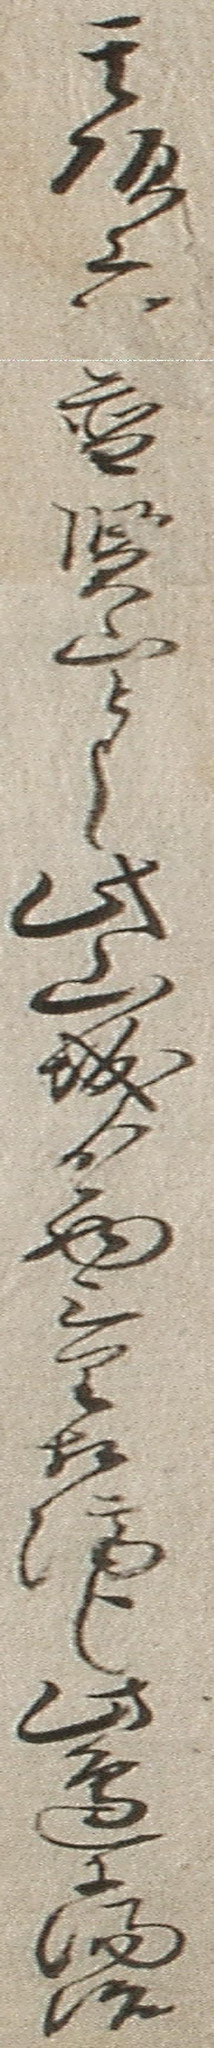其頂上は普賢山と申候此山城ゟ西三里相隔申候此辺に湯治
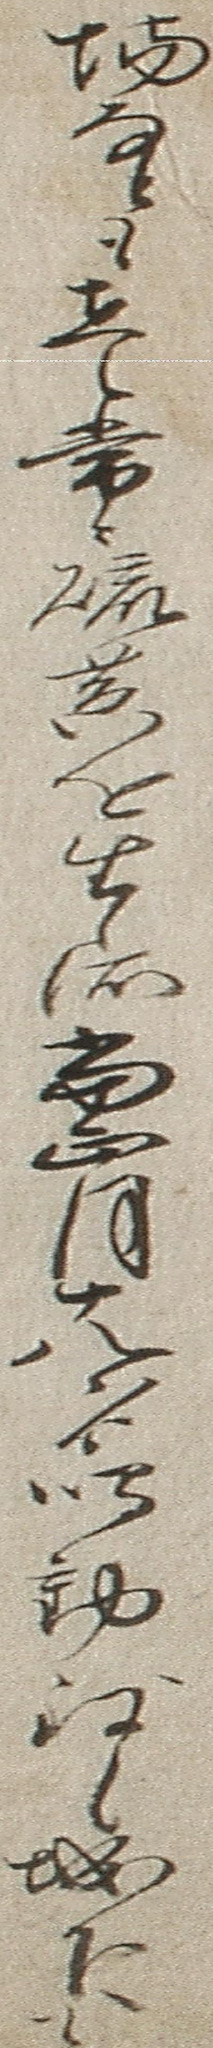場なとも在之常々硫黄を生候所当正月十八日ゟ鳴動致候城下へも
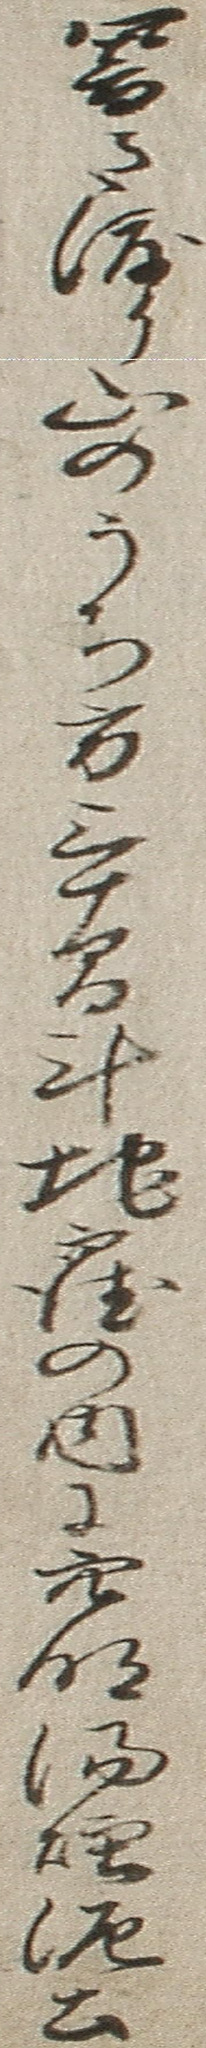響き渡り山のうち方三十間斗地窪の内に穴明湯煙泥土

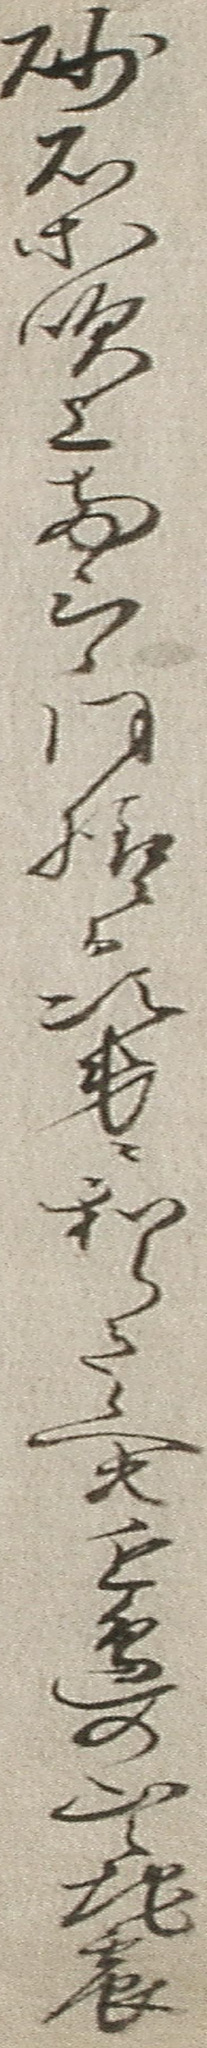砂石等吹上兩三日同様に而次第に和らき候へ共近辺の山々地震
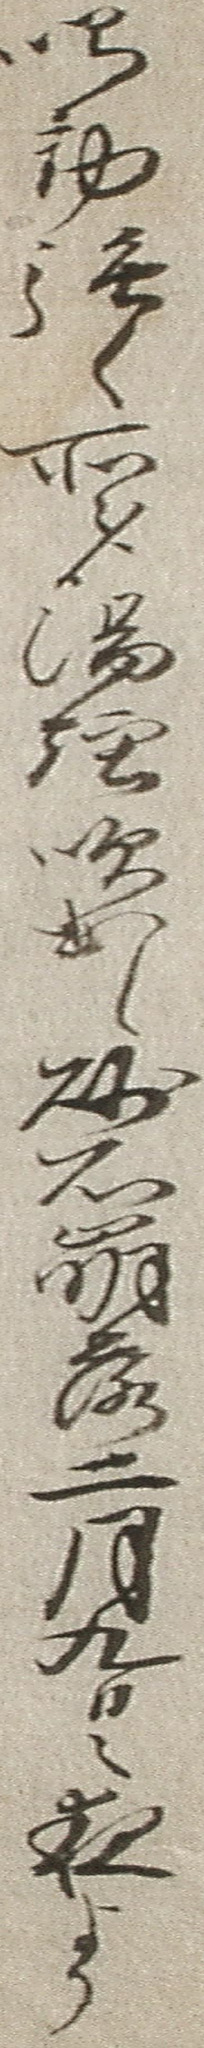鳴動強く所々ゟ湯煙吹出し砂石崩落二月九日之夜より
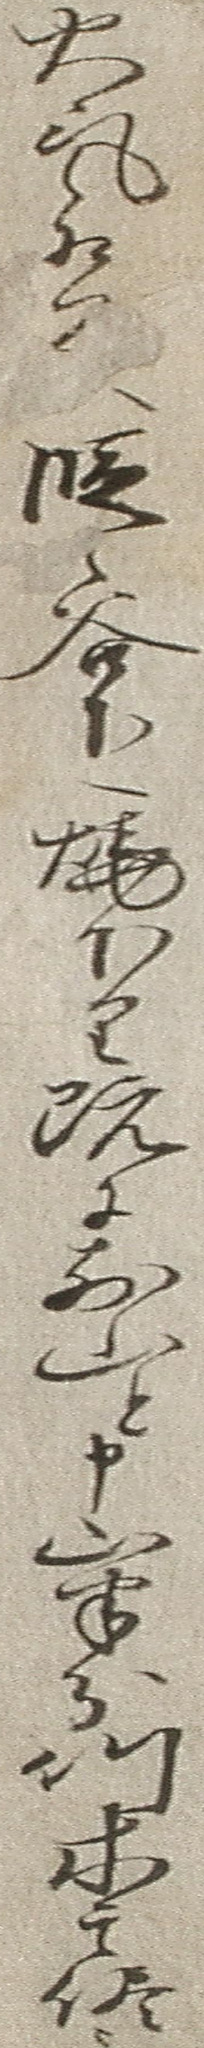火気相見へ段々谷下へ焼下り既に前山と申山半分竹木其侭に
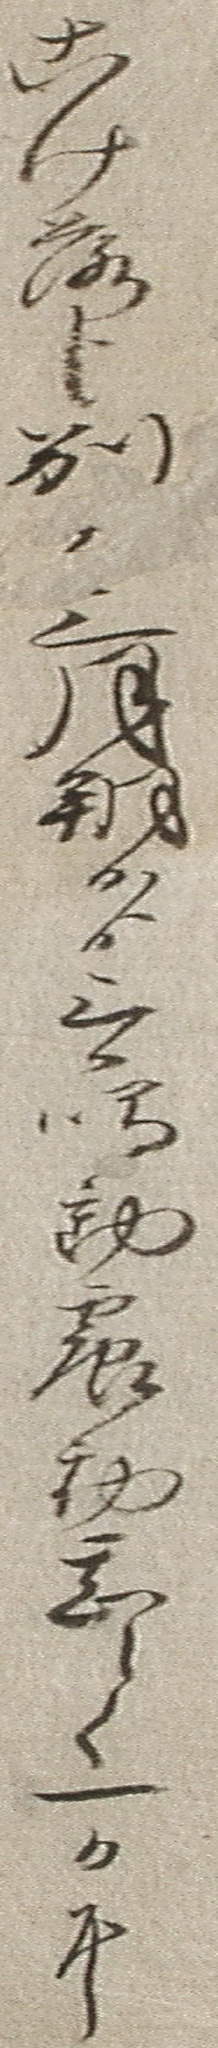こけ落申候別而三月朔日ゟ三日鳴動震動甚しく一日に
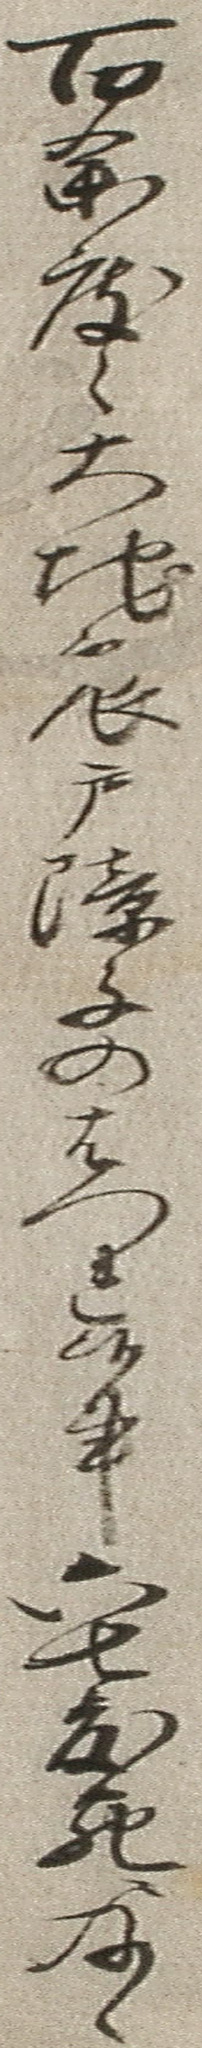百余度の大地震戸障子のはつれ候事六七度宛に及候
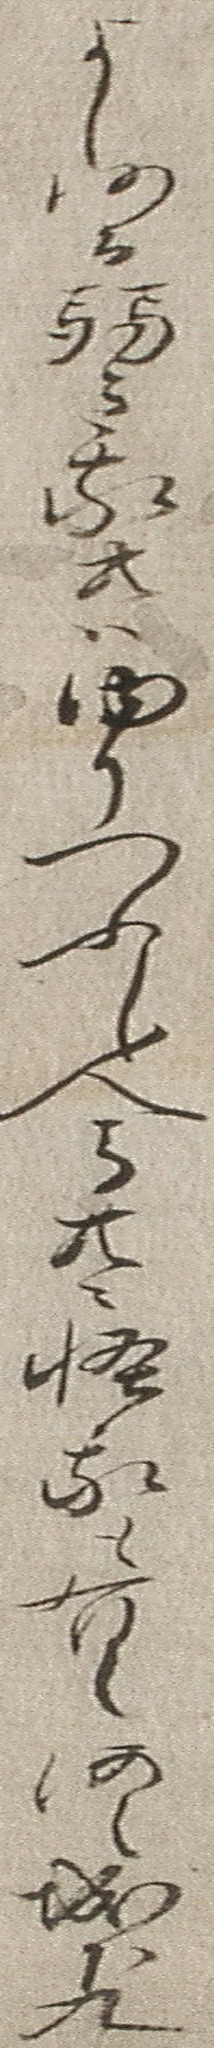よし仍而弱き家共はゆりつふし人馬共に怪我も有之仍之城下九
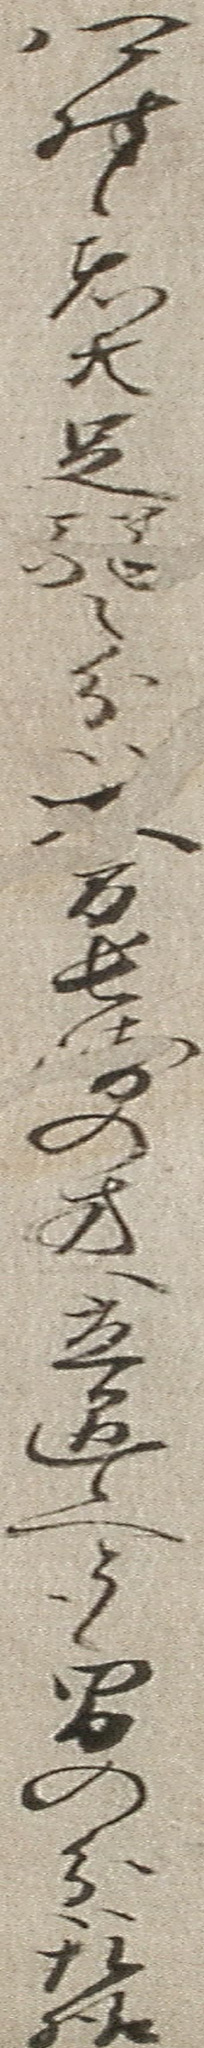郷村之者共足弱之分は大方長崎の方へ立退候へとも男の分は左様
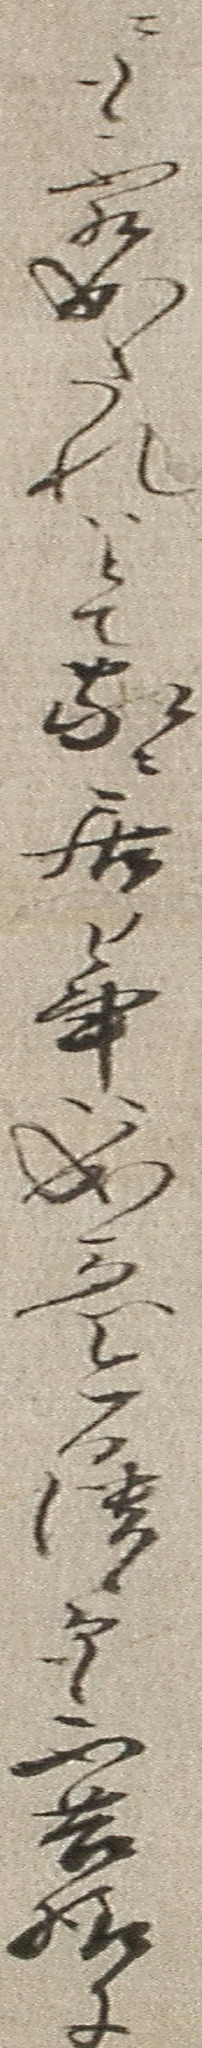にも不相成されはとて家に居り候事は成恵と而潰候而も不苦様に
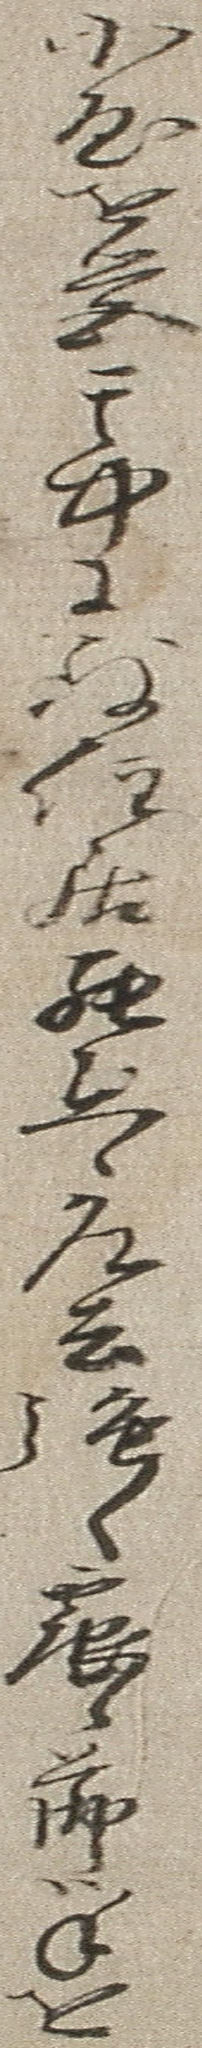小屋を営其中に致住居罷在候乍去強く震候節は手を
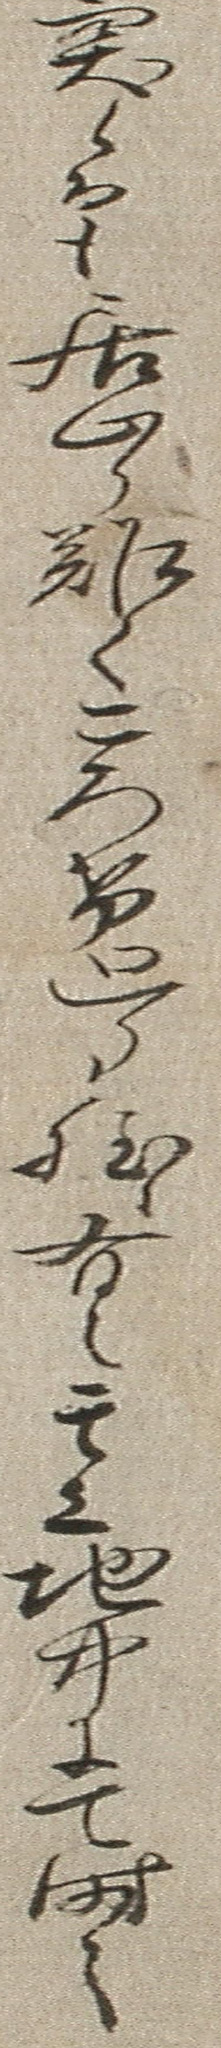突候而も居止り難くころけ廻り候程に有之其上地中にて時々
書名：太平秘録抜書　浅間山燒及普賢山崩
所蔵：東京大学地震研究所図書室 Earthquake Research Institute Library, The University of Tokyo, JAPAN
